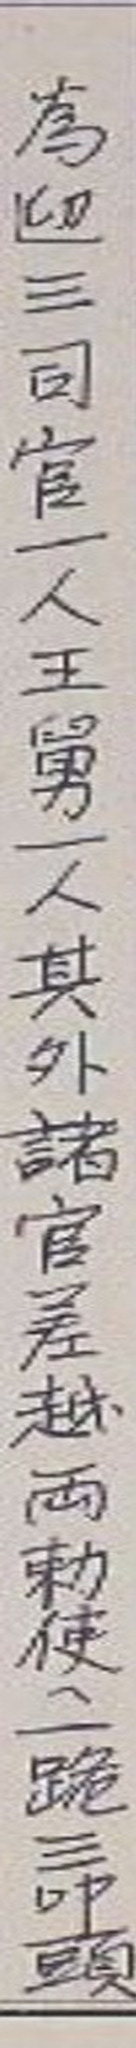為迎三司官一人王舅一人其外諸官差越両勅使へ一跪三叩頭
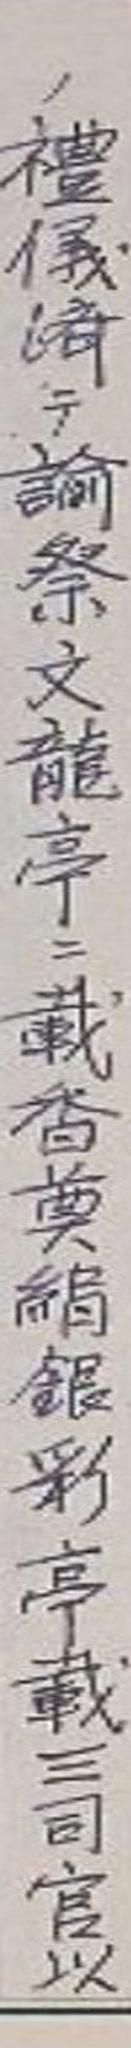の礼儀済て諭祭文龍亭に載香奠絹銀彩亭載三司官以
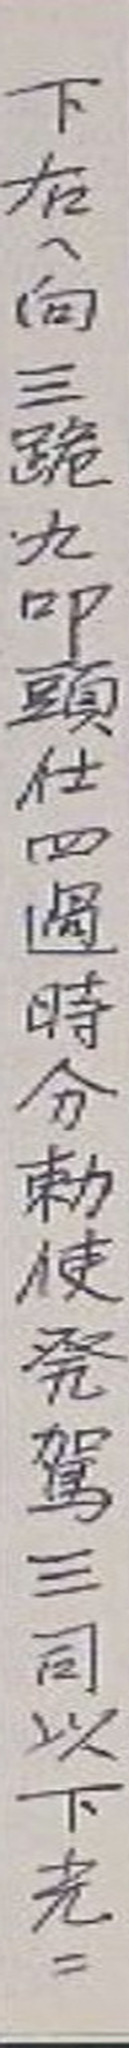下右へ向三跪九叩頭仕四過時分勅使発駕三司官以下先に
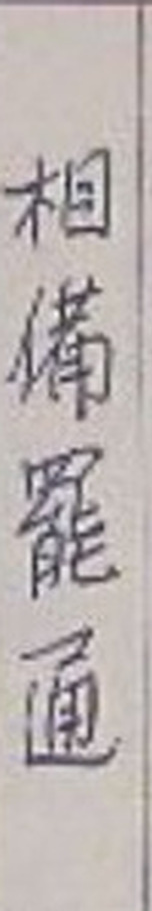相備罷通
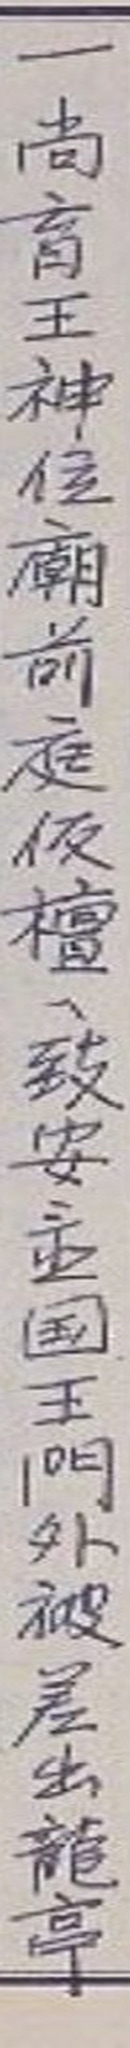一尚育王神位廟前庭仮檀へ致安置国王門外被差出龍亭
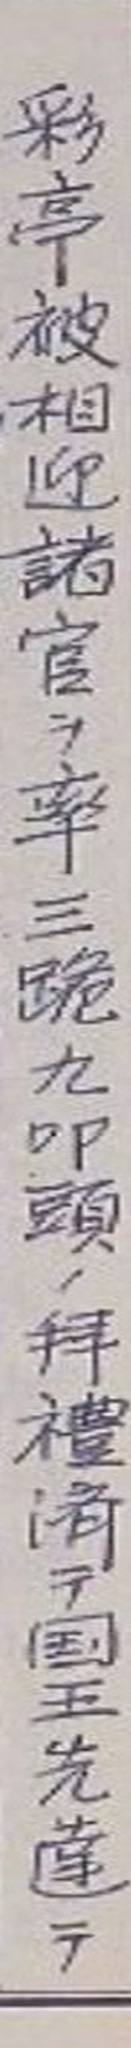彩亭被相迎諸官を率三跪九叩頭の拝礼済て先達て
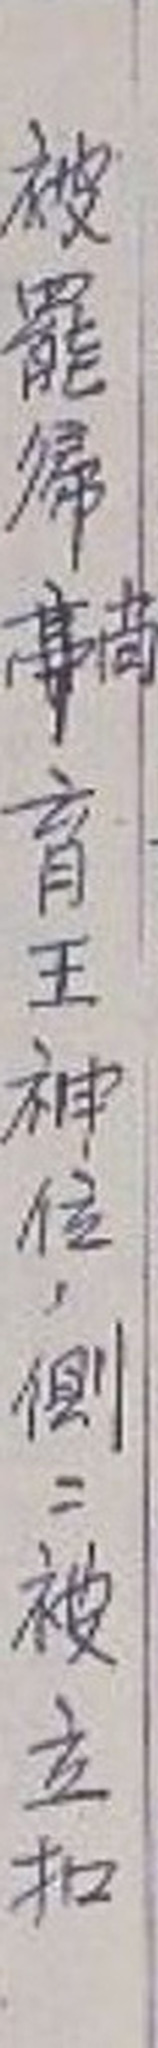被罷帰尚育王神位の側に被立扣
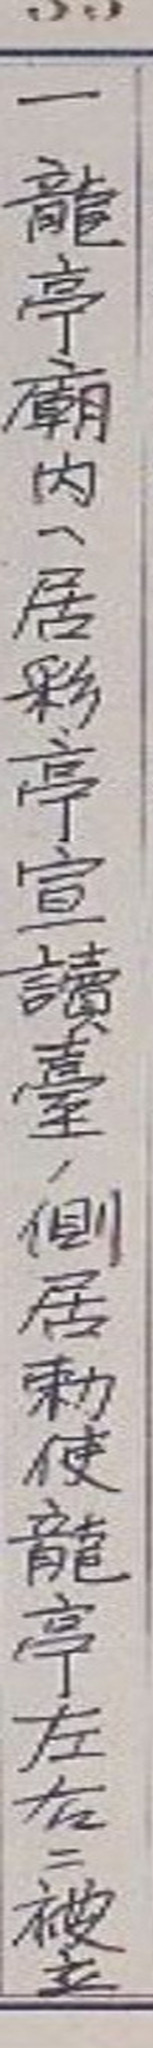一龍亭廟内へ居彩亭宣読台の側居勅使龍亭左右に被立
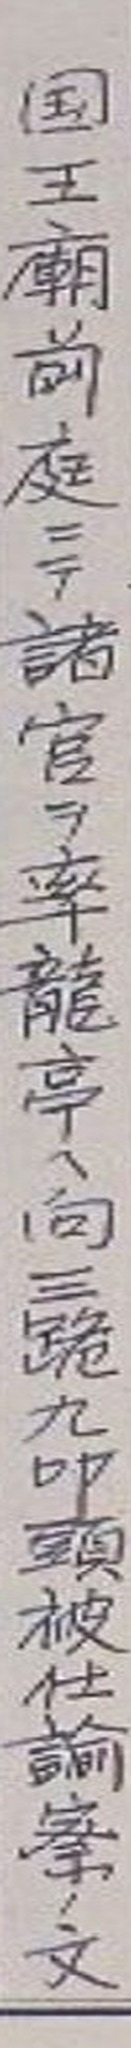国王廟前庭にて諸官を率龍亭へ向三跪九叩頭被仕諭察の文
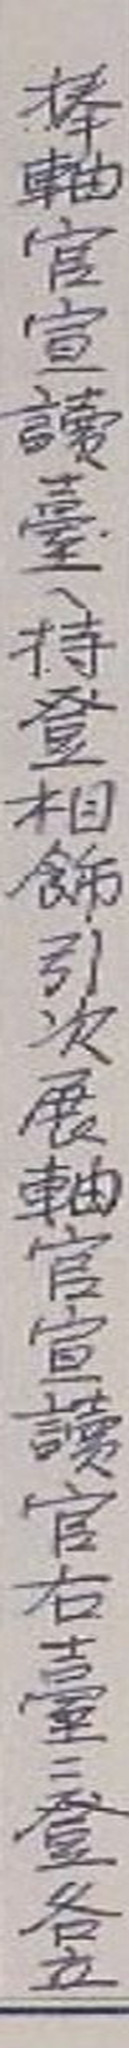捧軸官宣読台へ持登相飾引次展軸官宣読官右台に登各立

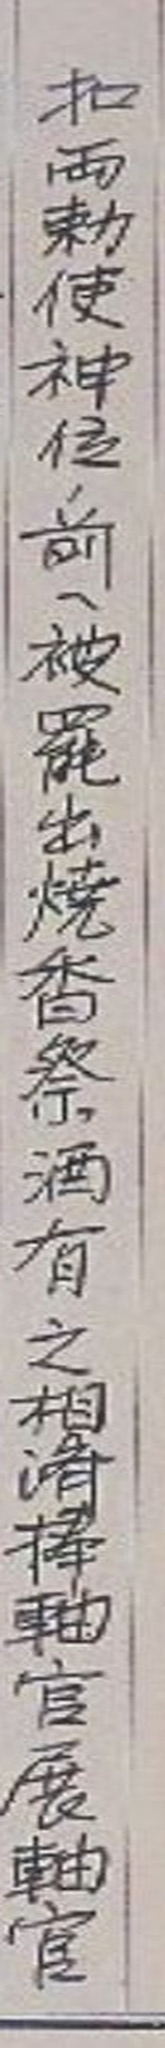扣両勅使神位の前へ被罷出焼香祭酒有之相済捧軸官展軸官
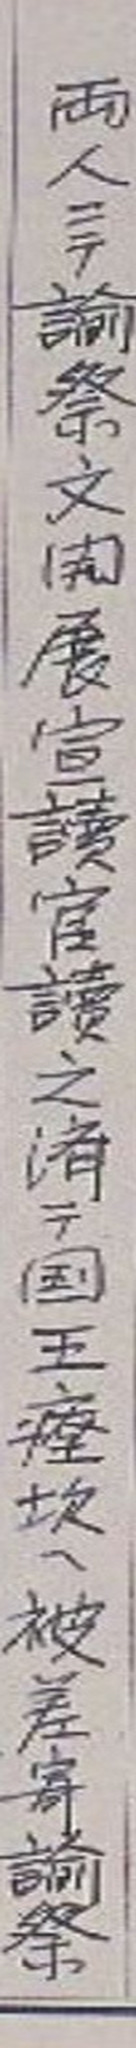両人にて諭祭文開展宣読官読之済て国王瘞坎へ被差寄諭祭
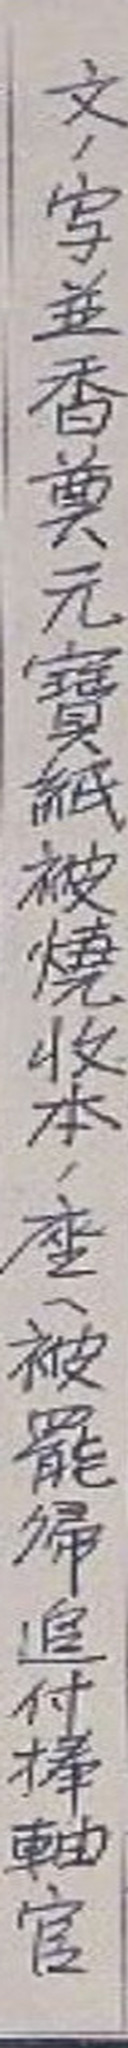文の写並香奠元宝紙被焼収本の座へ被罷帰追付捧軸官
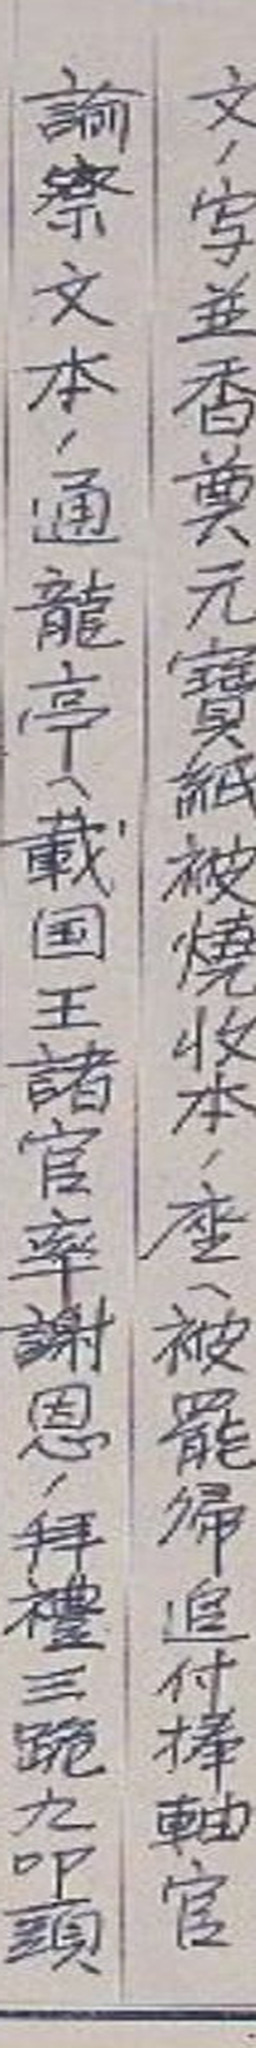諭祭文本の通龍亭へ載国王諸官率謝恩の拝礼三跪九叩頭
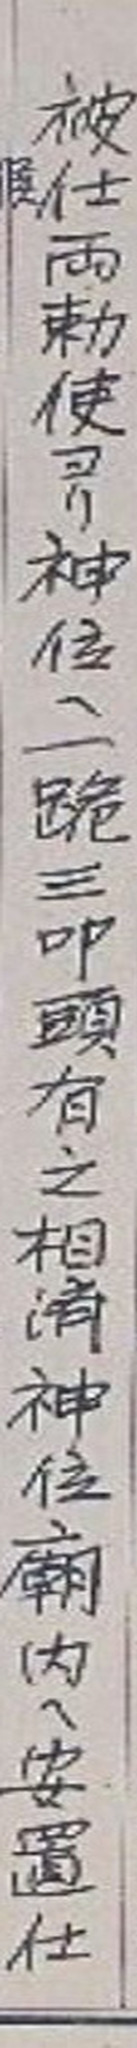被仕両勅使より神位へ一跪三叩頭有之相済神位廟内へ安置仕
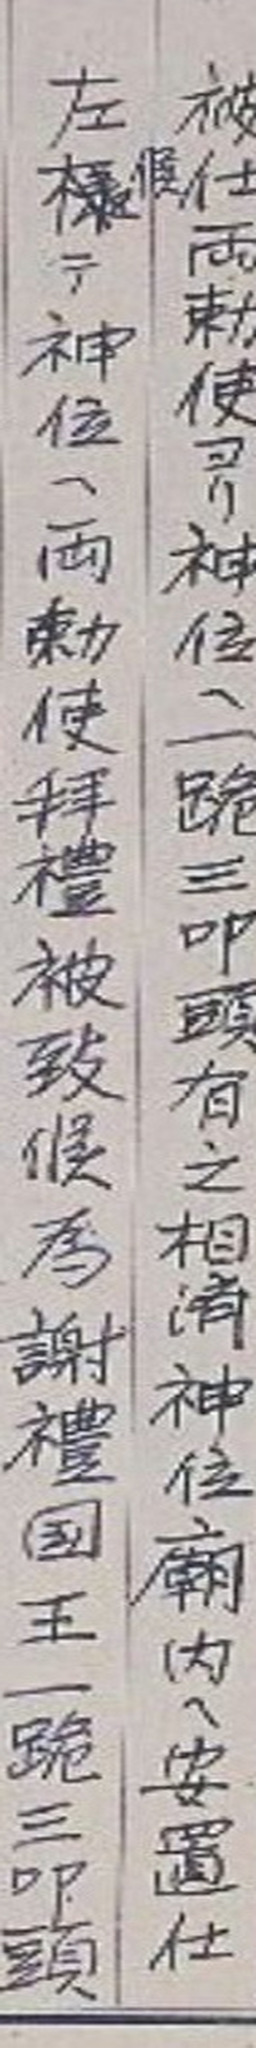左候て神位へ両勅使拝礼被致候為謝礼国王一跪三叩頭
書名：支那冊封使来琉諸記 下巻
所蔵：University of the Ryukyus Library
